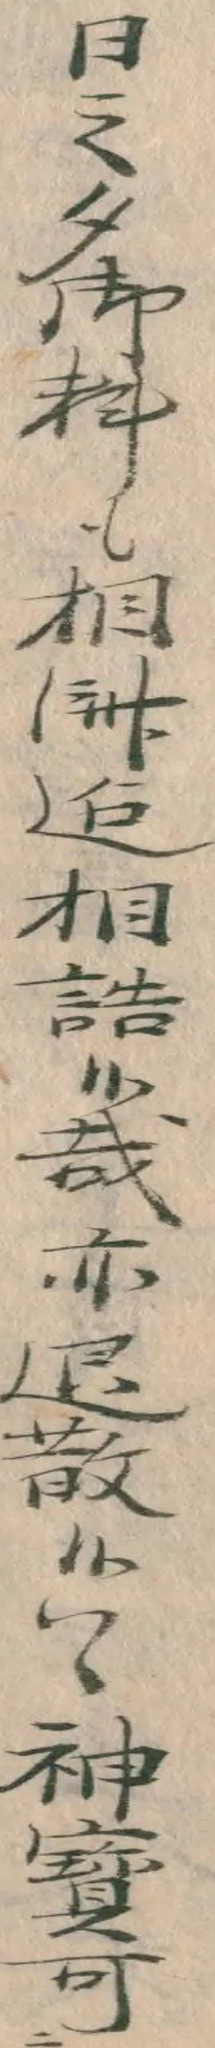日之夕御料も相済迄相詰候哉亦退散候ハヽ神寶可
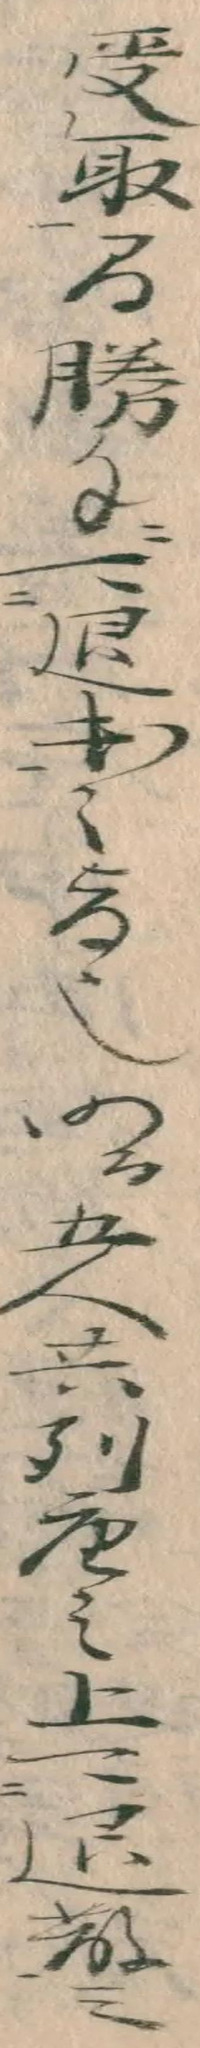受取間勝手ニ可退義之旨也仍而五人共列座之上可退散之
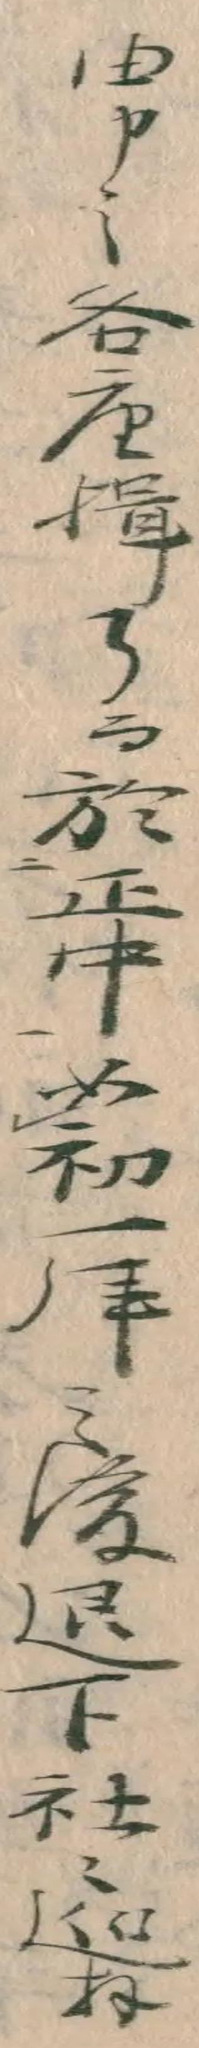由申之各座揖了而於正中如初一拝之後退下社々巡拝
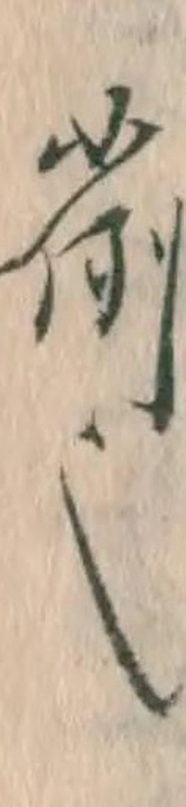如例也
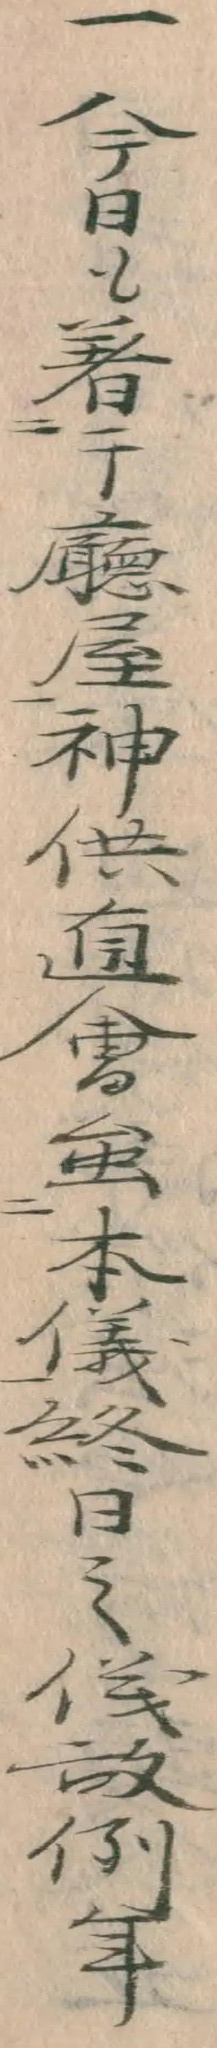一今日も着于廰屋神供直會虽本儀終日之儀故例年
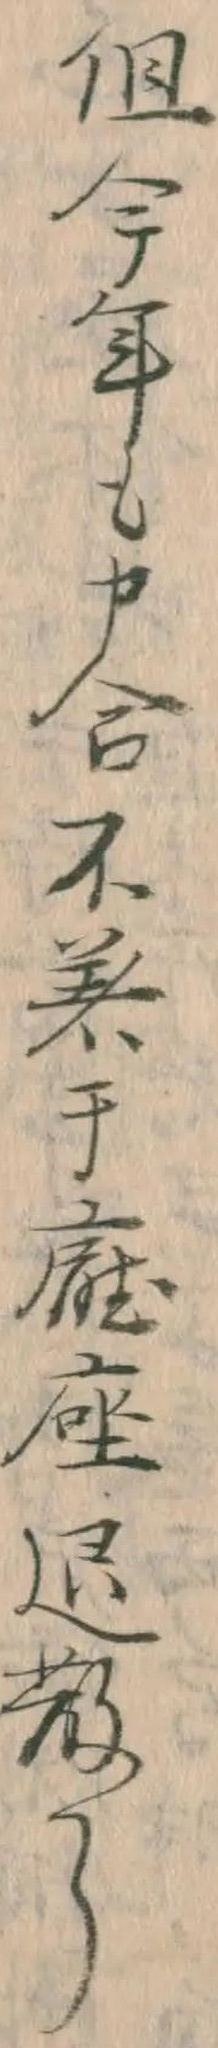但今年も申合不着于廰座退散了
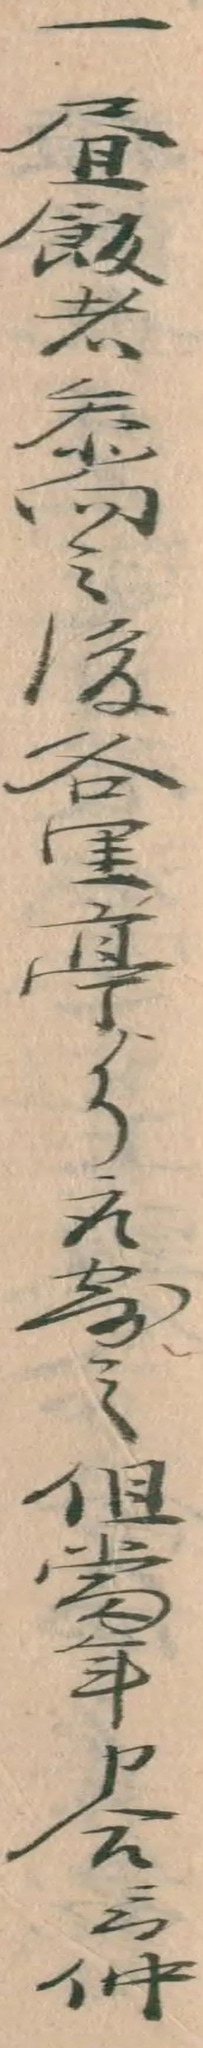一昼飯者参向之後各里亭より取寄之但當年申合二而仲
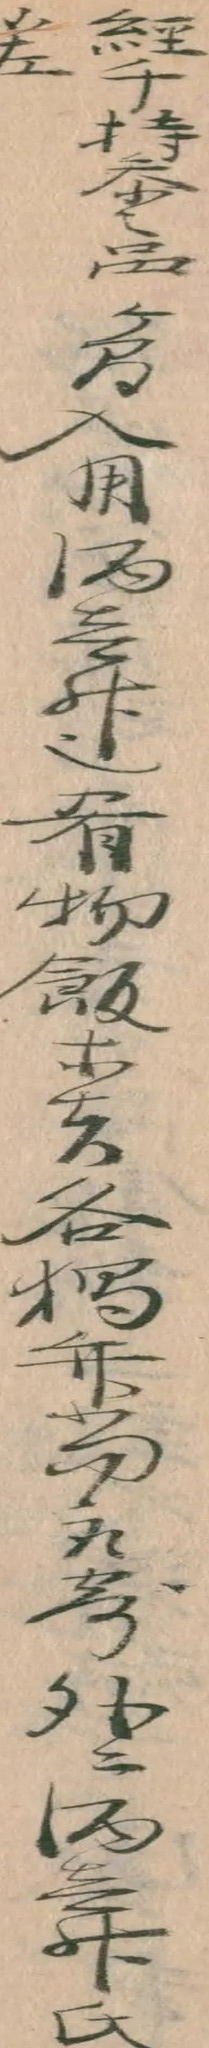ヶ間入用酒壱升也肴物飯等は各独弁當取寄外ニ酒一升氏
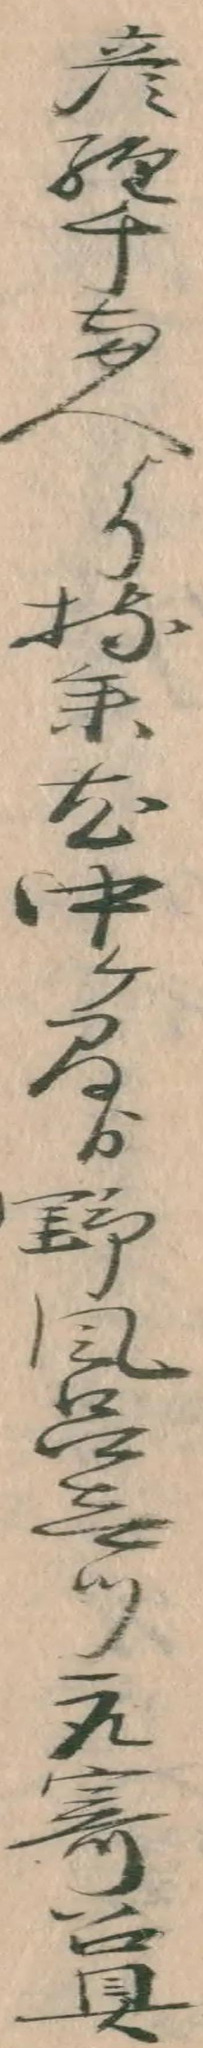彦経千両人より持参尤中ヶ間ゟ野風品壱ツ取寄召具
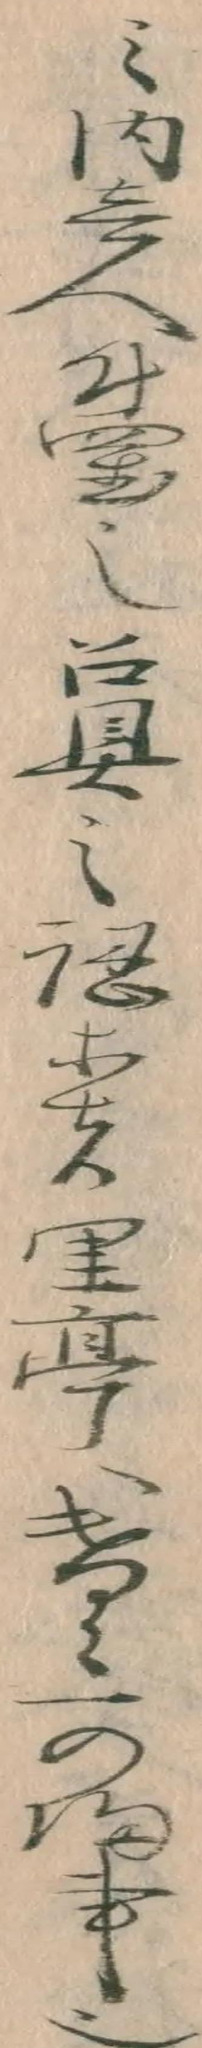之内壱人付置也召具之認等は里亭へ替て可帰事也
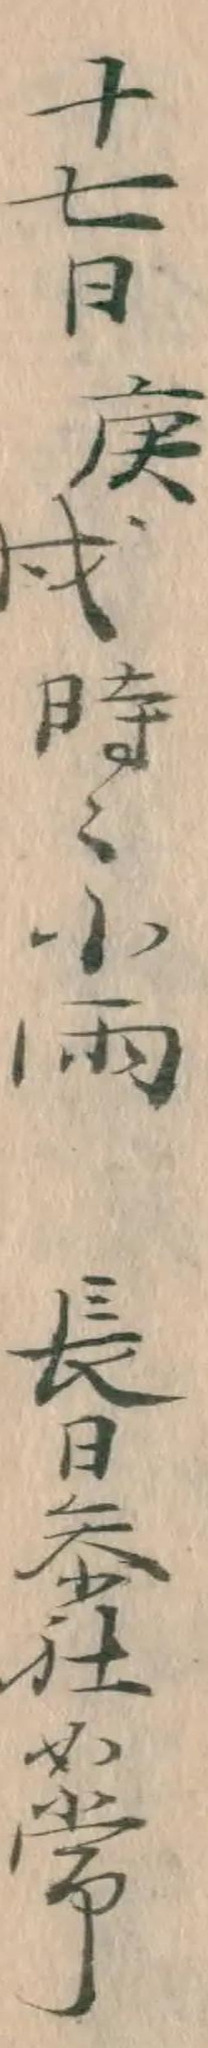十七日庚戌時々小雨長日参社如常
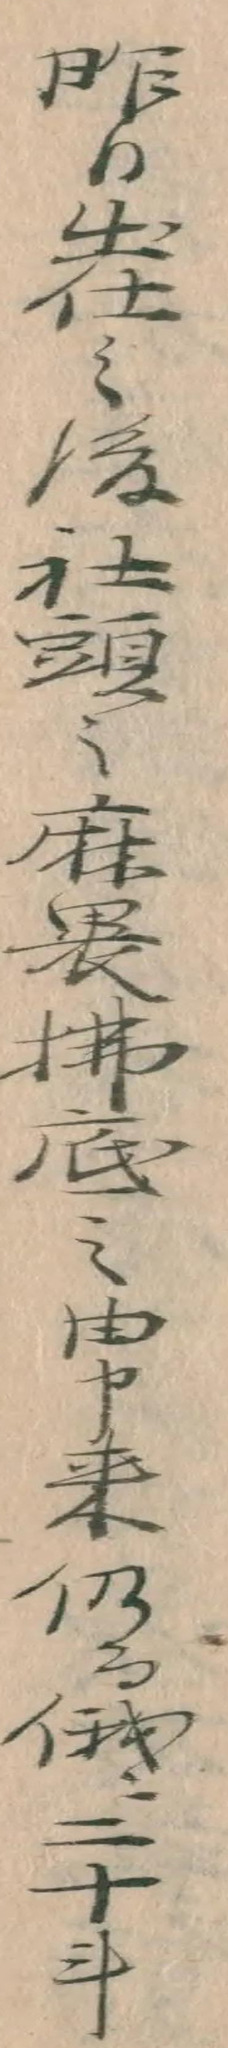一昨日出仕之後社頭之麻褁払底之由申来仍而俄ニ二十斗
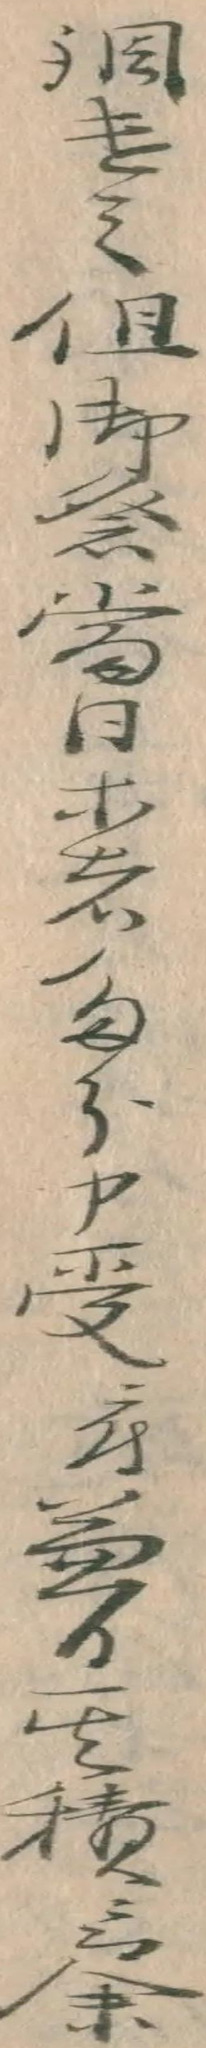調遣之但御祭當日等はたら申受ニ付兼日其積ニ而余
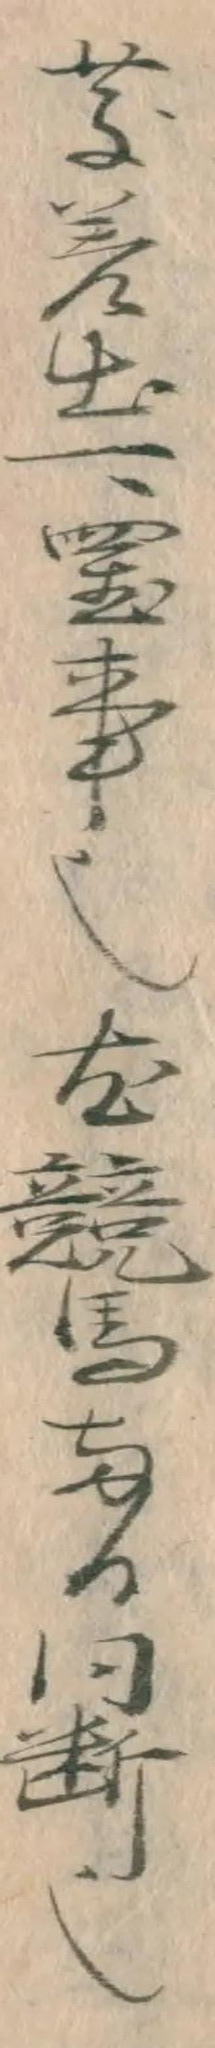茎差出可置事也尤競馬両日同断也
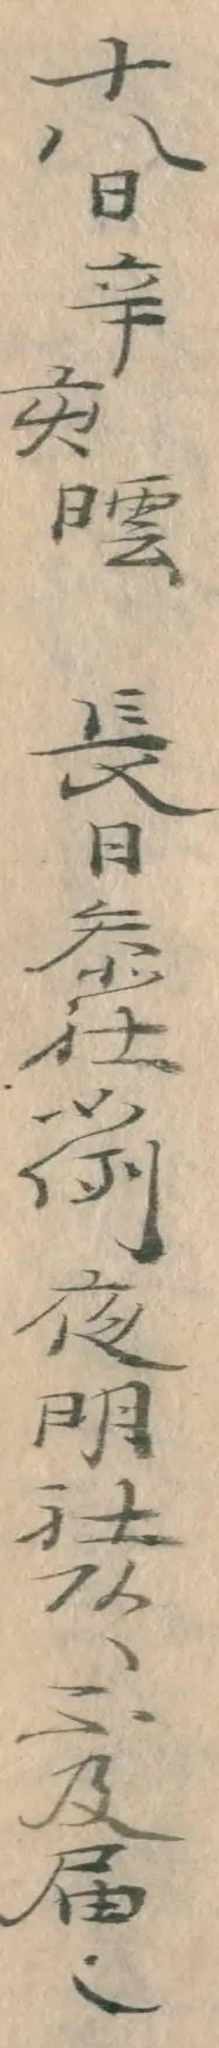十八日辛亥雲長日参社如例夜明社頭へ不及届也
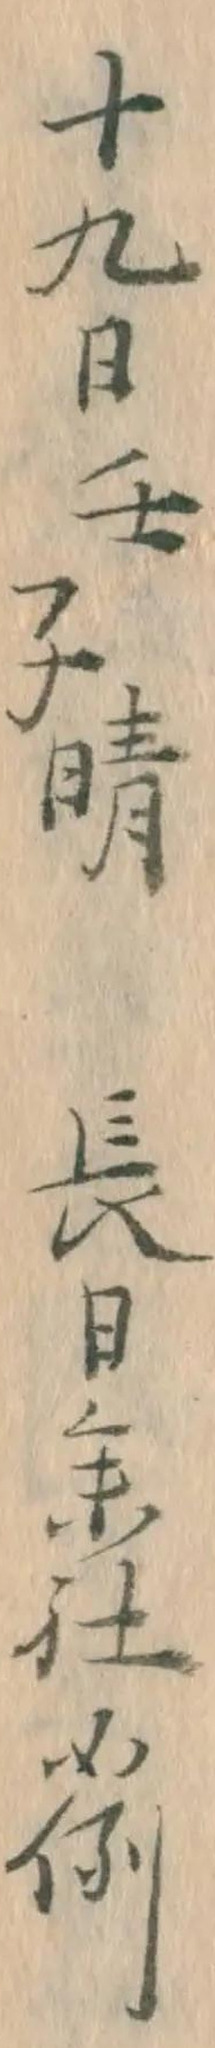十九日壬子晴長日参社如例
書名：賀茂社記録. 第73冊
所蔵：国立国会図書館 National Diet Library, JAPAN
